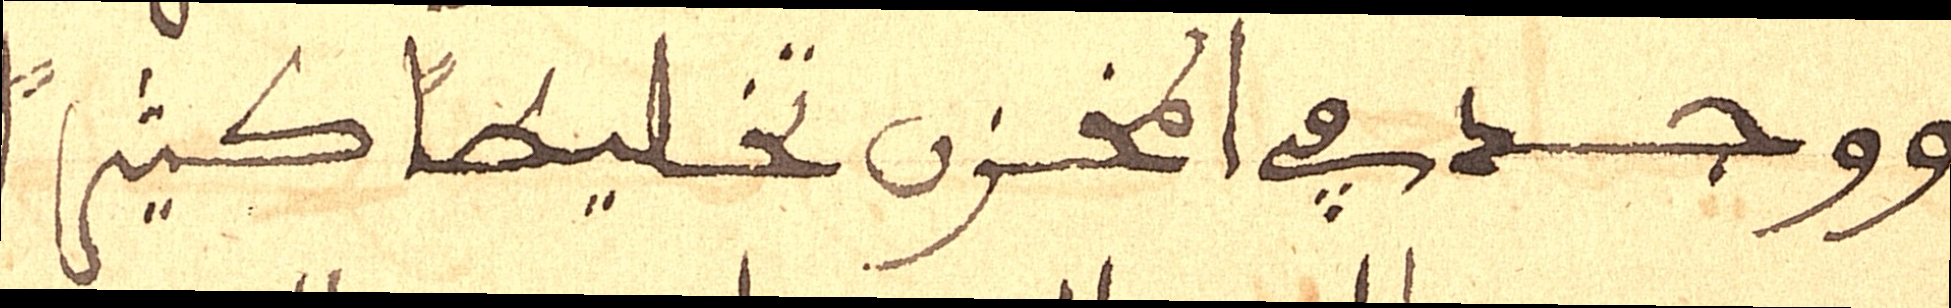ووجد في المخزن تخليطا كثيرا
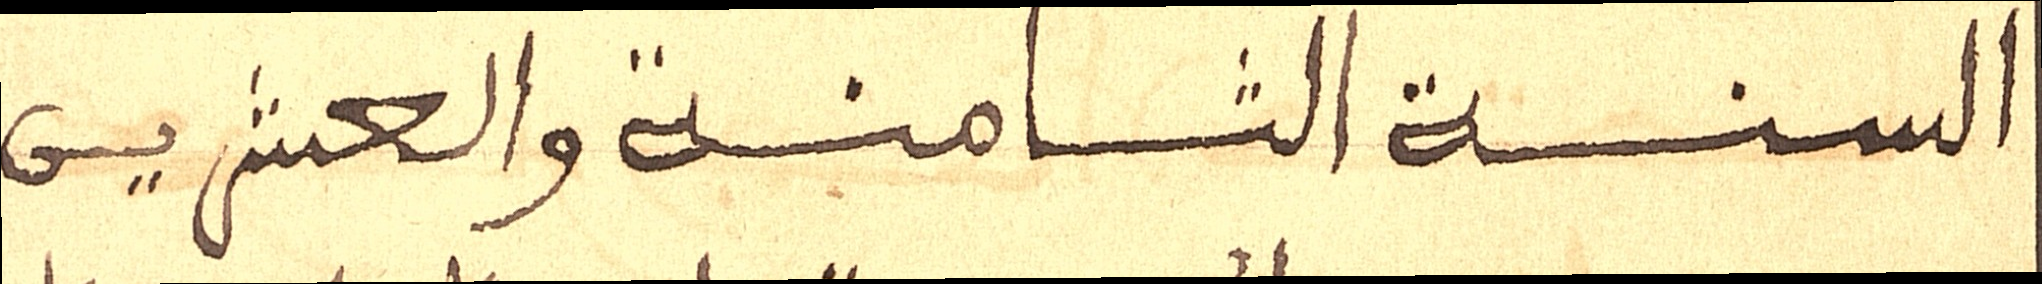السنة الثامنة العشرين
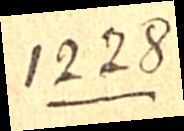1228
